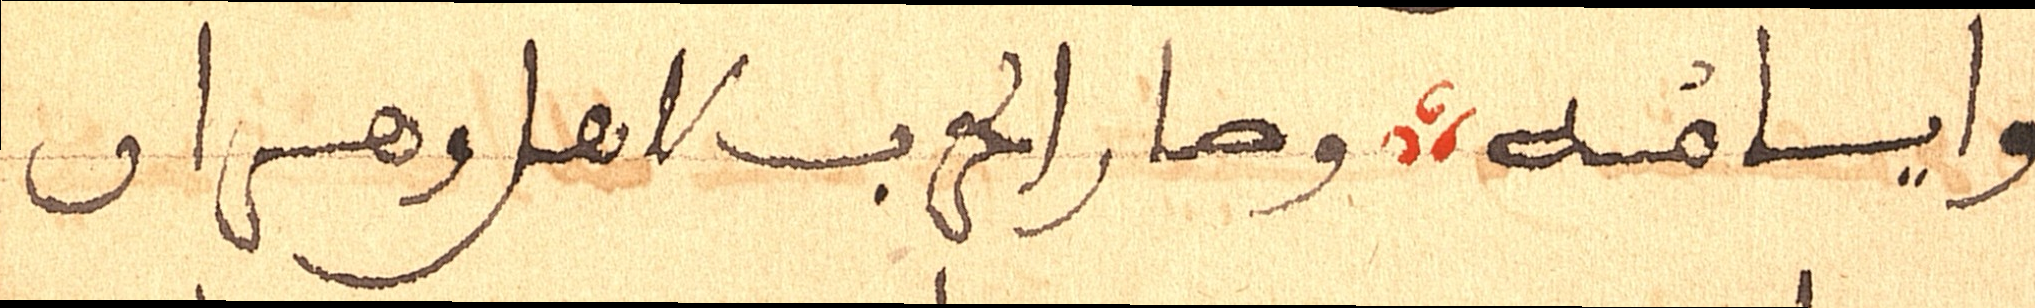وايامه وصار الحرب لاهل وهرن
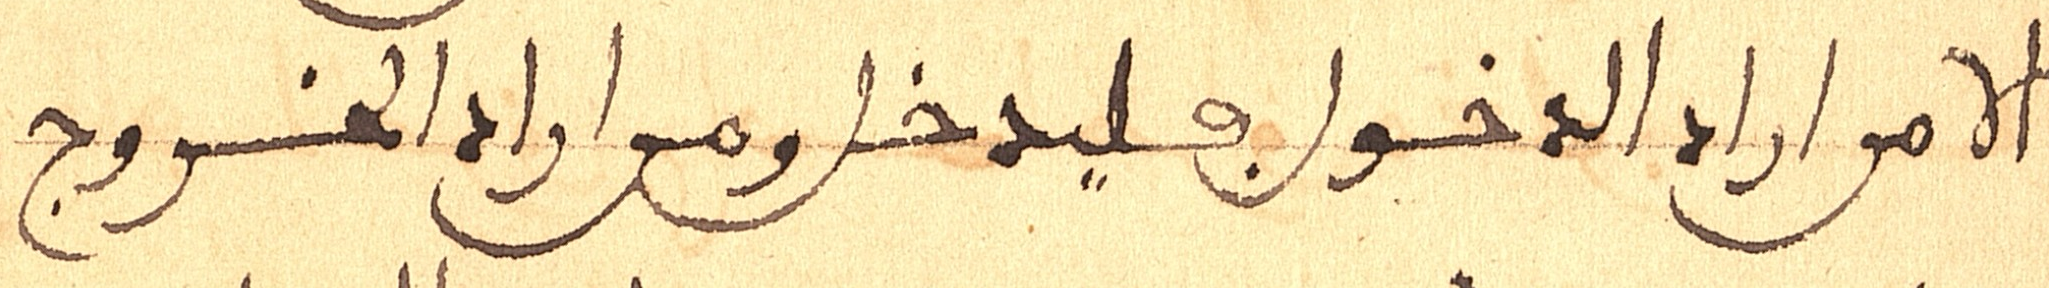الامن اراد الدخول فليدخل ومن اراد الخروج
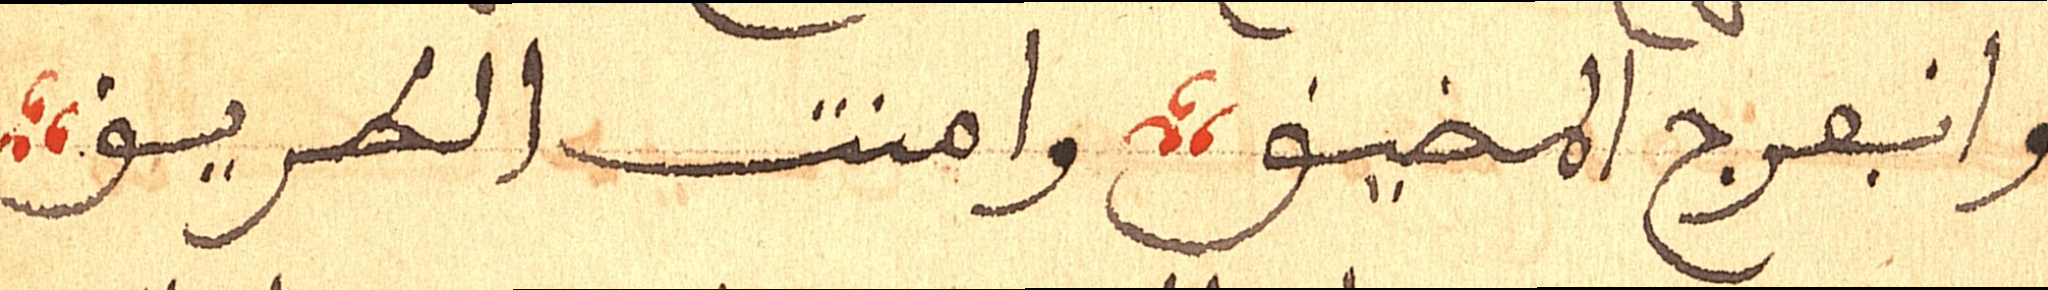وانفرج المضيق وامنت الطريق
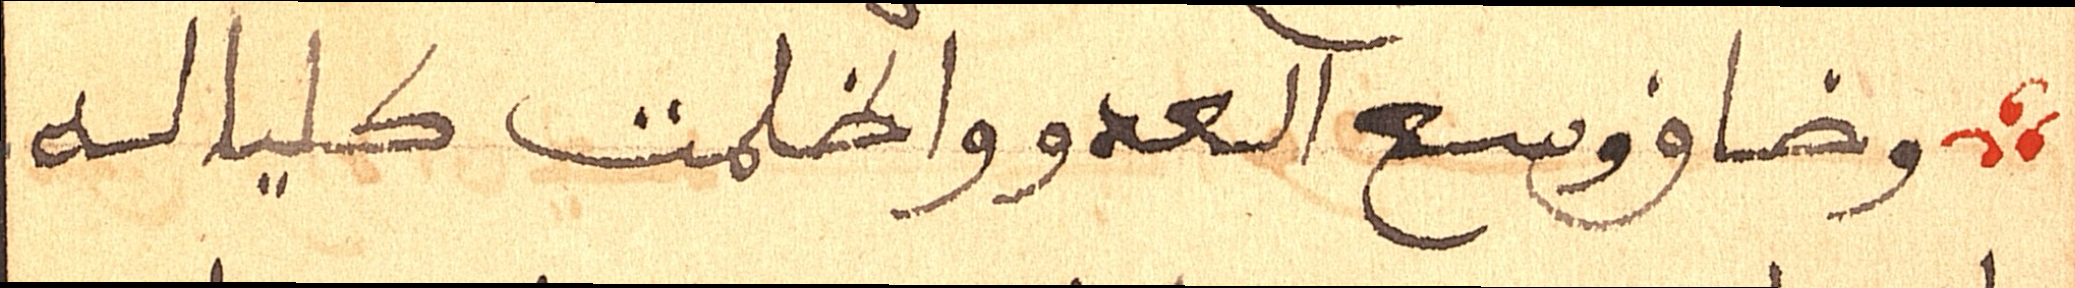وضاق وسع العدو واظلمت كليا له
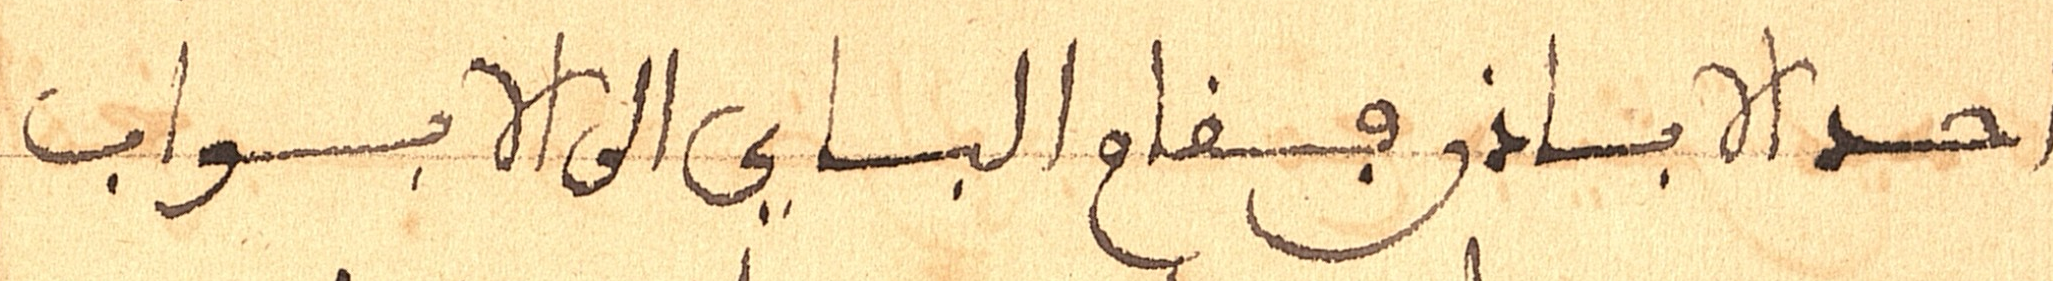احد الا باذن فقام الباي الى الابواب
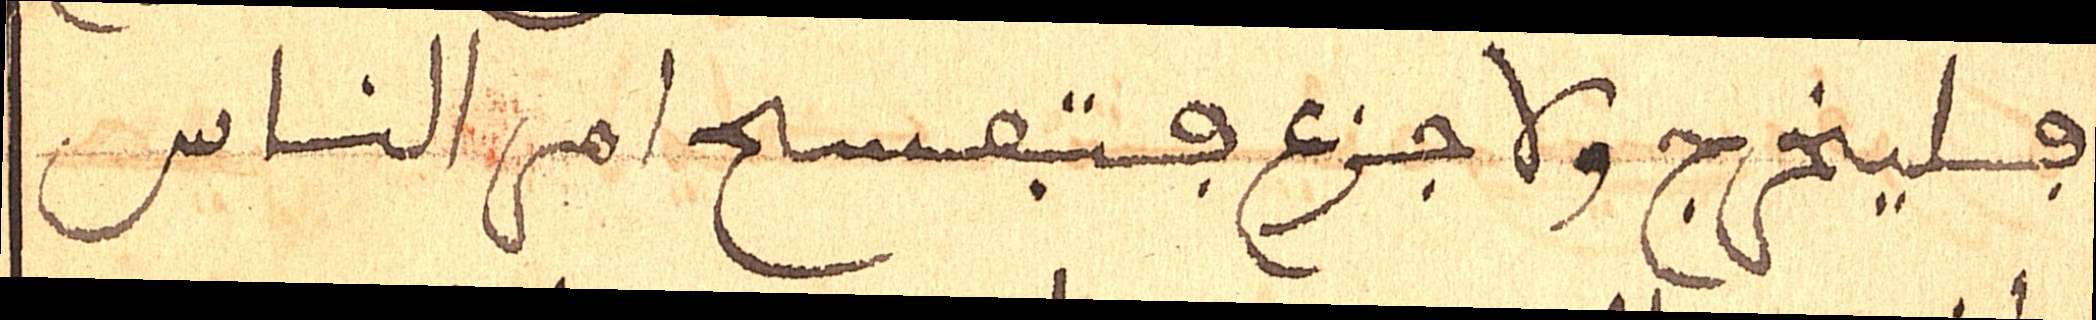فليخرج ولا جزع فتقسح امر الناس
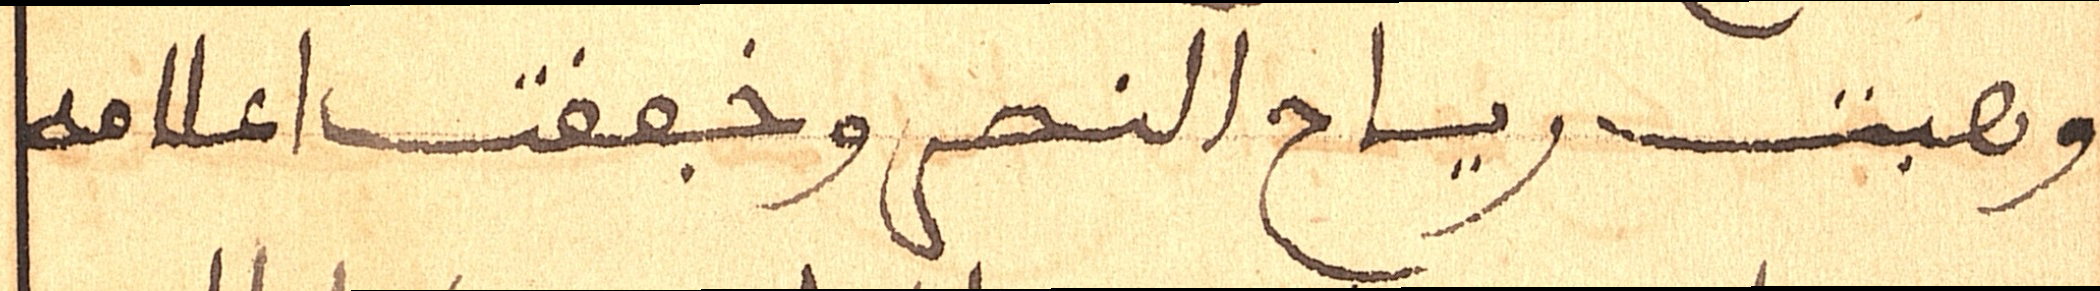وهبت رياح النصر وخفقت اعلامه
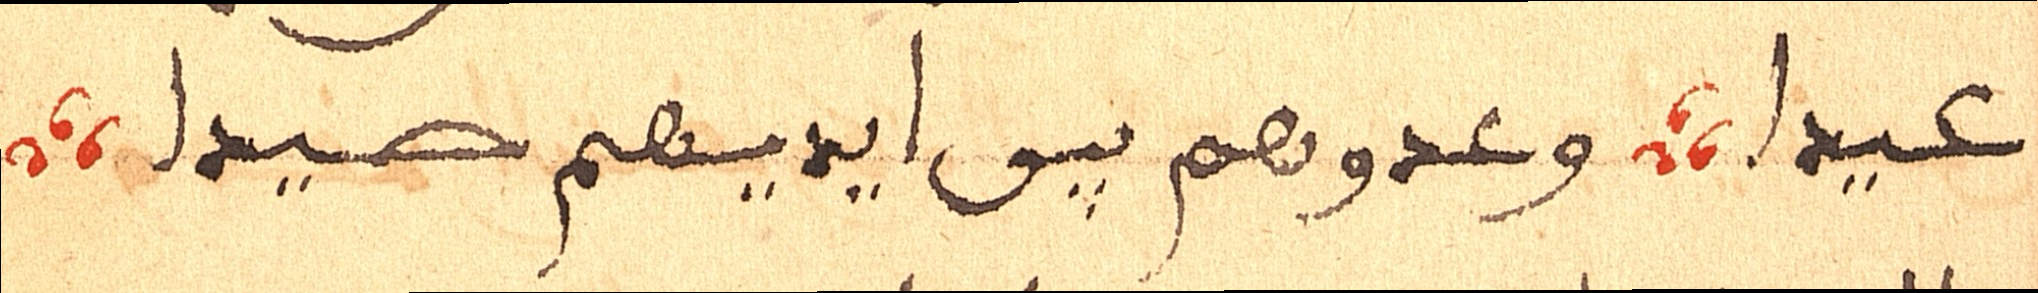عيدا وعدوهم بين ايديهم صيدا
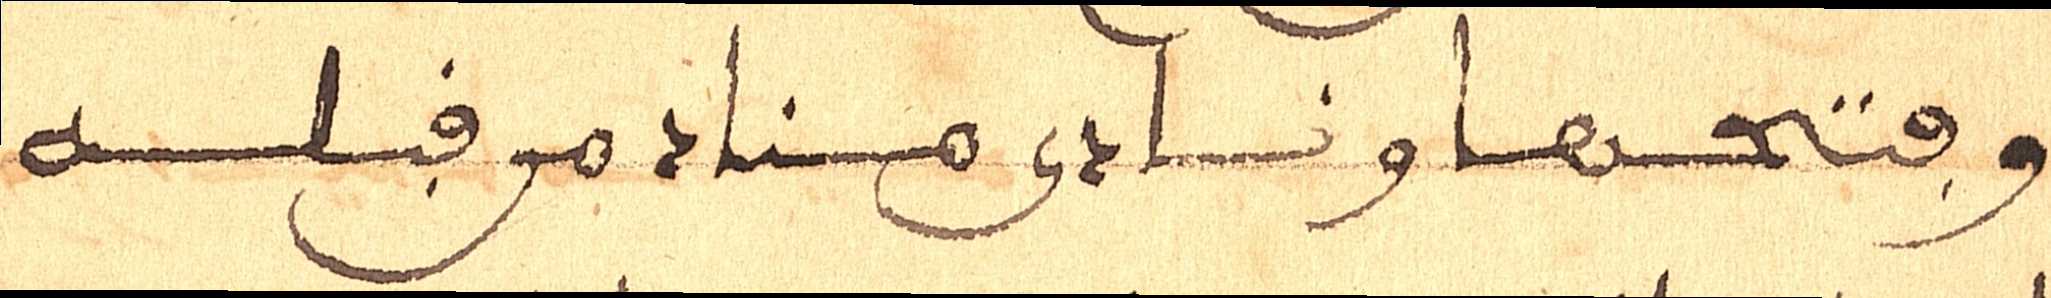وفتحها ونادى مناد من قبله
